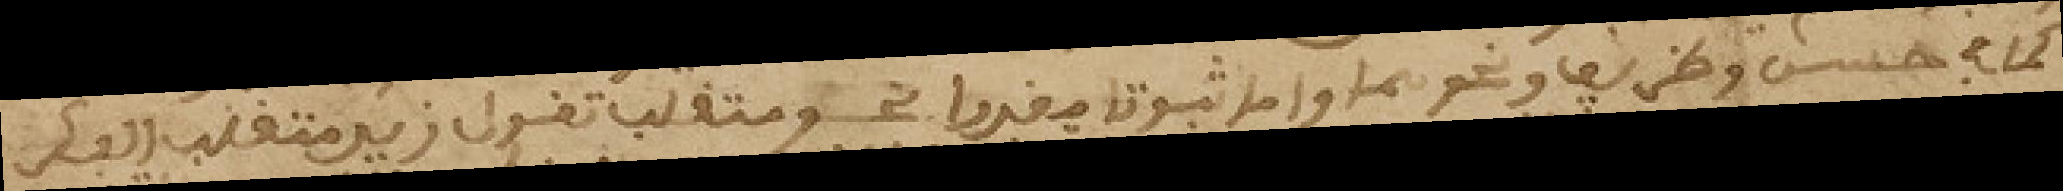كما في حسن وظريف ونحوهما واما ثبوتا مقدرا نحو متقلب تقول زيد متقلب الفكر
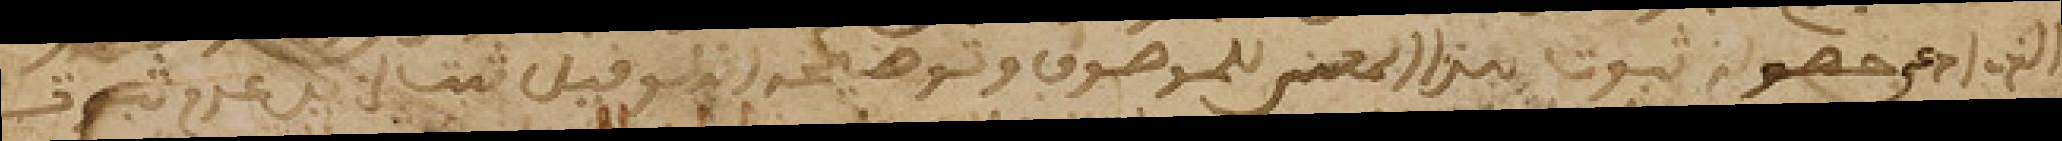الذي ادعى حصوله ثبوت بهذا المعنى للموصول وتوضيحه انه لو قيل ثبت لزيد عدم ثبوت
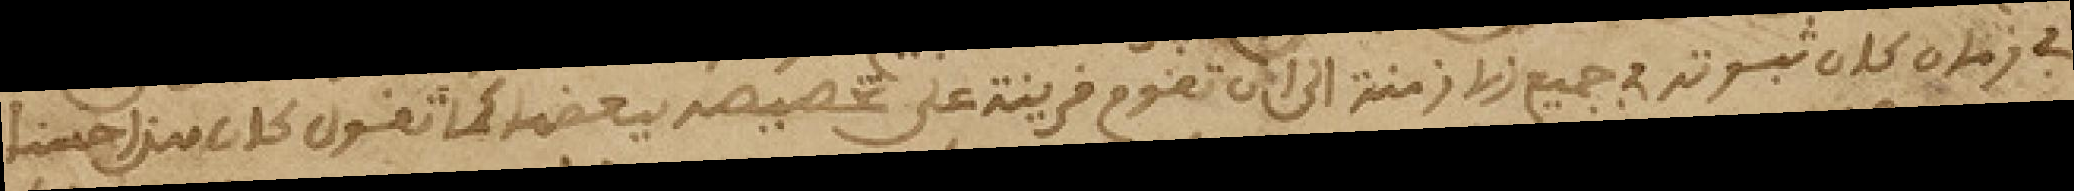في زمان كان ثبوته في جميع الازمنة الى ان تقوم قرينة على تخصيصه ببعضها كما تقول كان # ممزا حسنا
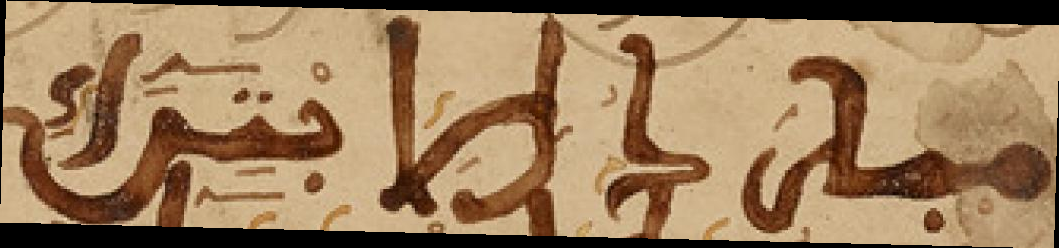مبارك الابتداء
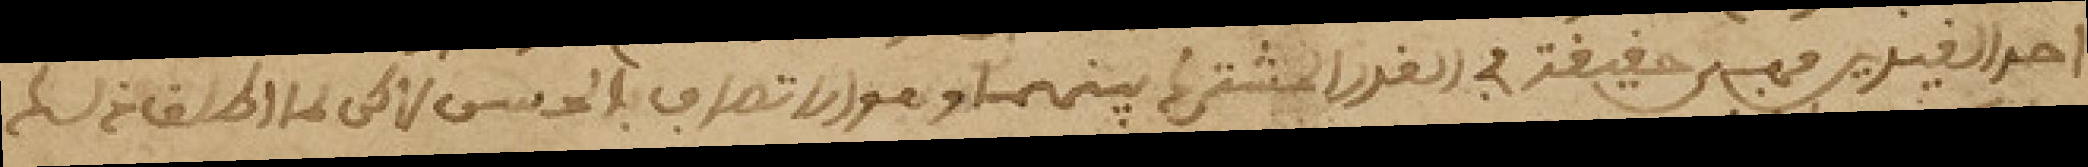احد الغيرين فهي حقيقة في القدر المشترك بينهما وهو الاتصاف بالحسن لاكن لما اطلق ذلك
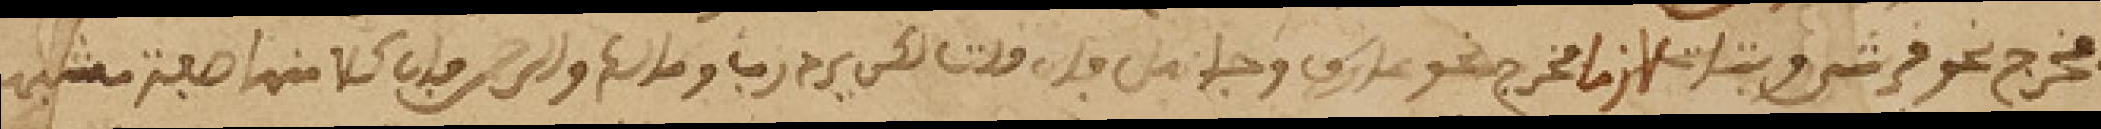فخرج نحو قرشى وبتات لازما فخرج نحو عارف وجاهل فان قلت لكى يرد رب ومالك والرحمى فان كلا منها صفة مشبهة
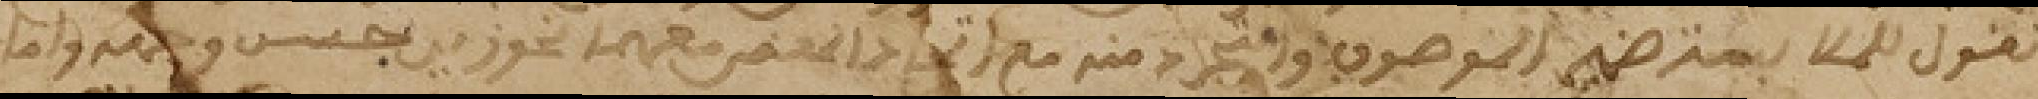نقول للملابسة ضمير وللتجرد منه مع اتحاد المعنى معها نحو زيد حسن وجهه واما
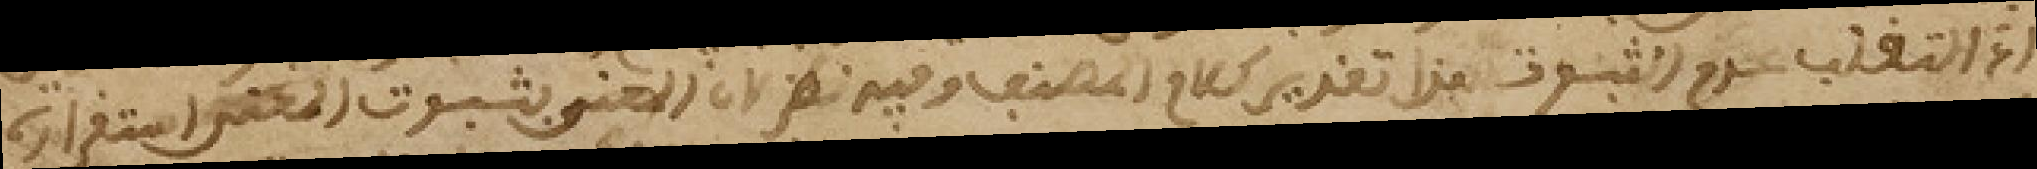اذ التقلب عدم الثبوت هذا تقدير كلام المصنف وفيه نظر لان المعنى بثبوت المعنى استقراره
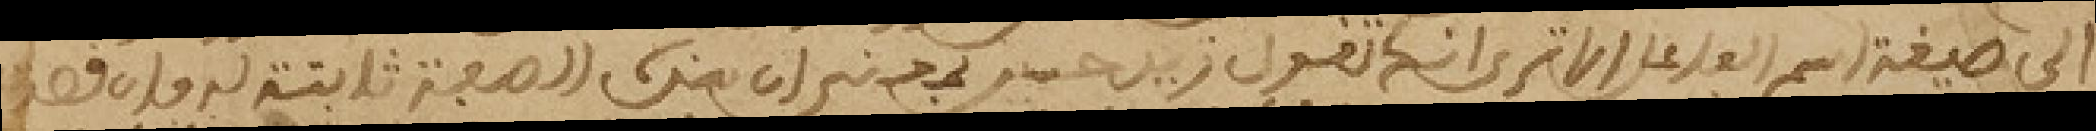الى صيغة اسم الفاعل الا ترى انك تقول زيد حسن بمعنى ان # مضمره الصفة ثابتة له فان قصدت
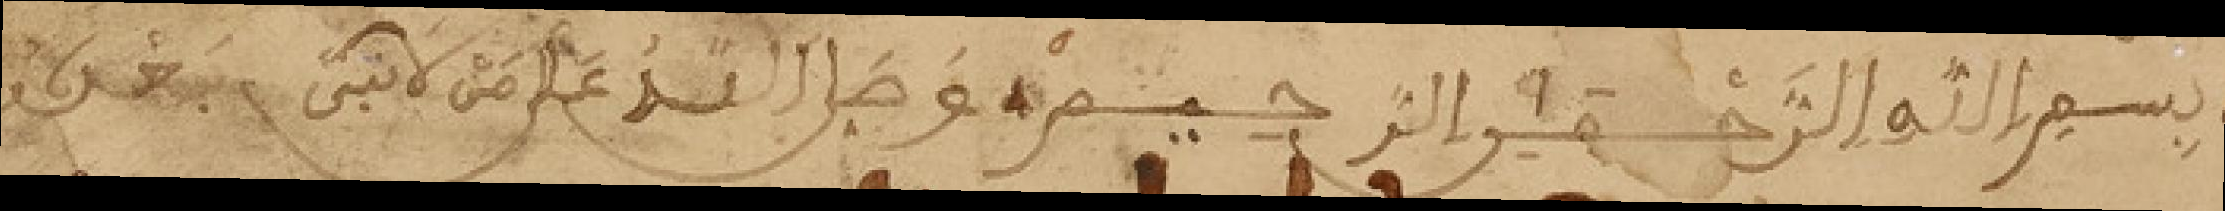بسم الله الرحمان الرحيم وصلى الله على من لا نبى بعده
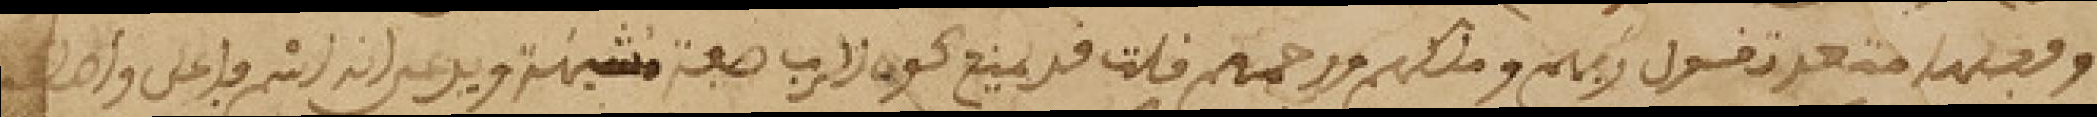وفعلها متعد تقول ربهم وملكهم ورحمهم قد يمنع كون الرب صفة مشبهة ويرعى انه اسم فاعل واصله
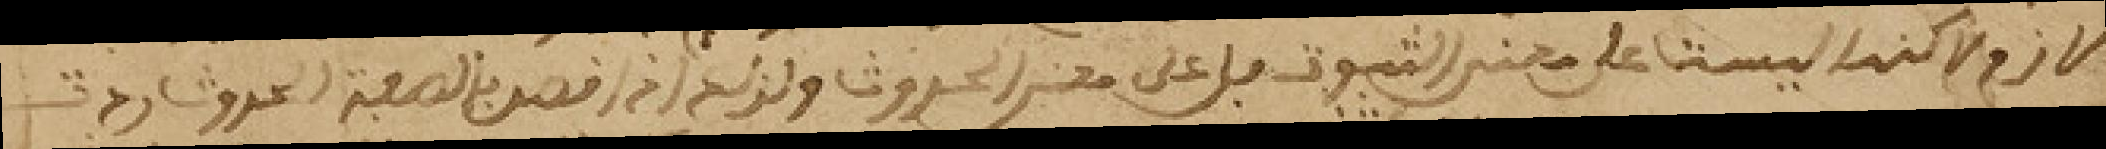لازم ولكنها ليست على معنى الثبوت بل على معنى الحدوث ولذلك اذا قصد بالصفة الحدوث ردت
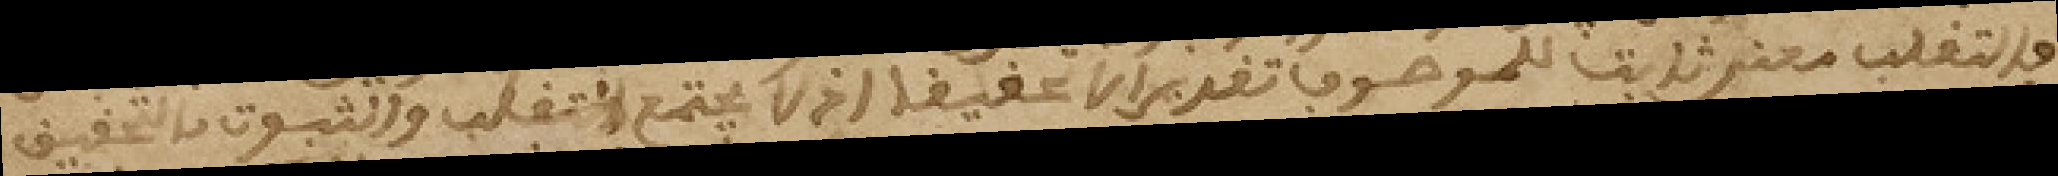فالتقلب معنى ثابت للموصوف تقديرا لا تحقيقا اذ لا يجتمع التقلب والثبوت بالتحقيق
